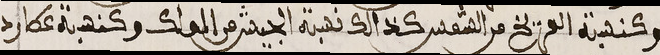وكنسبة المريخ من الشمس كذلك نسبة الجيش من الملك وكنسبة عطارد
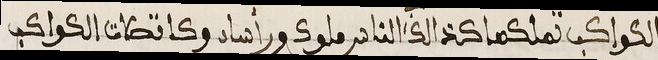الكواكب تملكها كذلك في الناس ملوك ورأساء وكاتصالات الكواكب
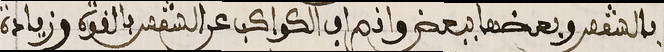بالشمس وبعضها ببعض وانصراف الكواكب عن الشمس بالقوة وزيادة
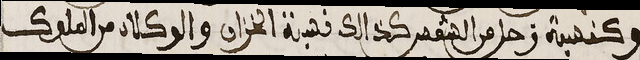وكنسبة زحل من الشمس كذلك نسبة الخزان والوكلاء من الملوك
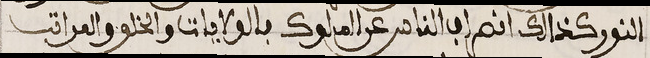النور كذلك انصراف الناس عن الملوك بالولايات والخلو والمراتب
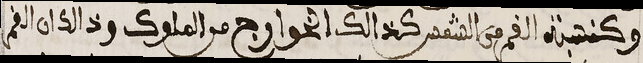وكنسبة القمر من الشمس كذلك الخوارج من الملوك وطالك ان القمر
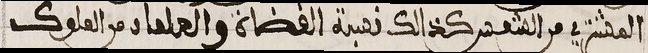المشتري من الشمس كذلك نسبة القضاة والعلماء من الملوك
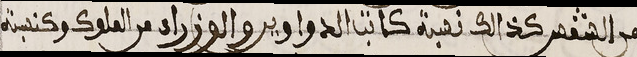من الشمس كذلك نسبة كاتب الدواوين والوزراء من الملوك وكنسبة
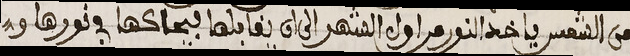من الشمس ياخد النور من اول الشهر الى ان يقابلها ليحاكها في نورها و
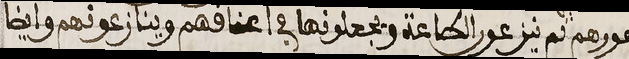مورهم ثم ينزعون الطاعة ويجعلونها في اعناقهم وينازعونهم وايضا
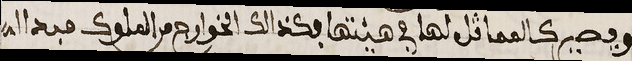ويصير كالمماثل لها في هيئتها فكذلك الخوارج من الملوك مبدا ا
